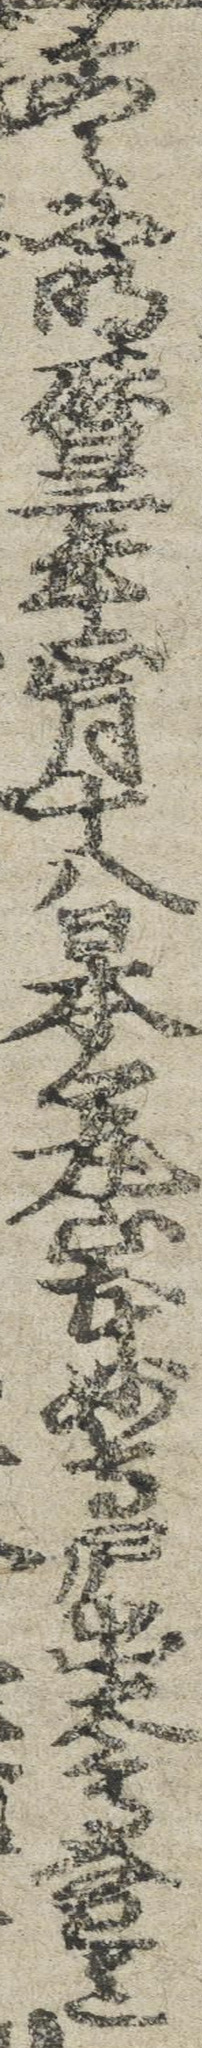こゝに明暦三年正月十八日本郷丸山本妙寺ヨリ出火高なわ迄
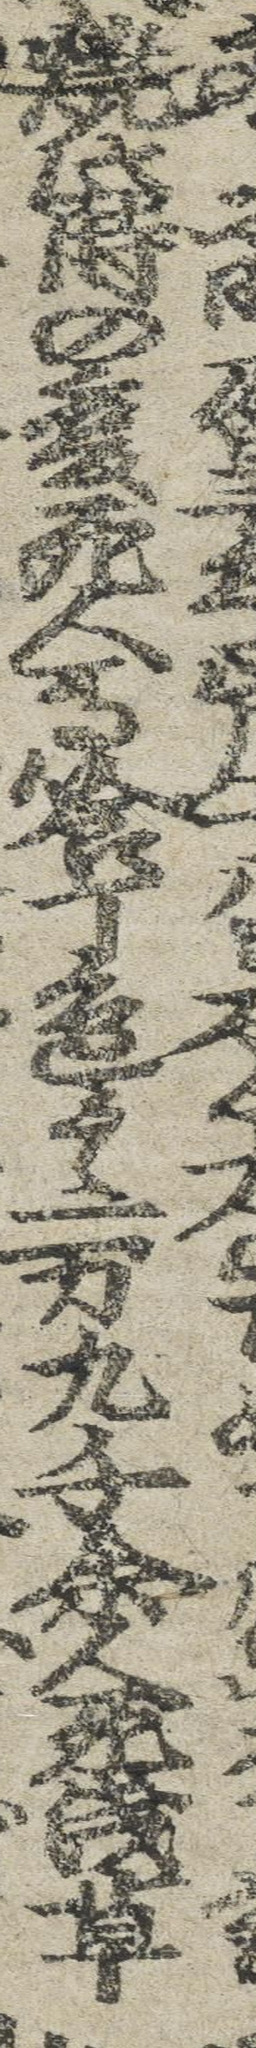焼此時の変死人馬喰丁邊にて一万九千余人死浅草
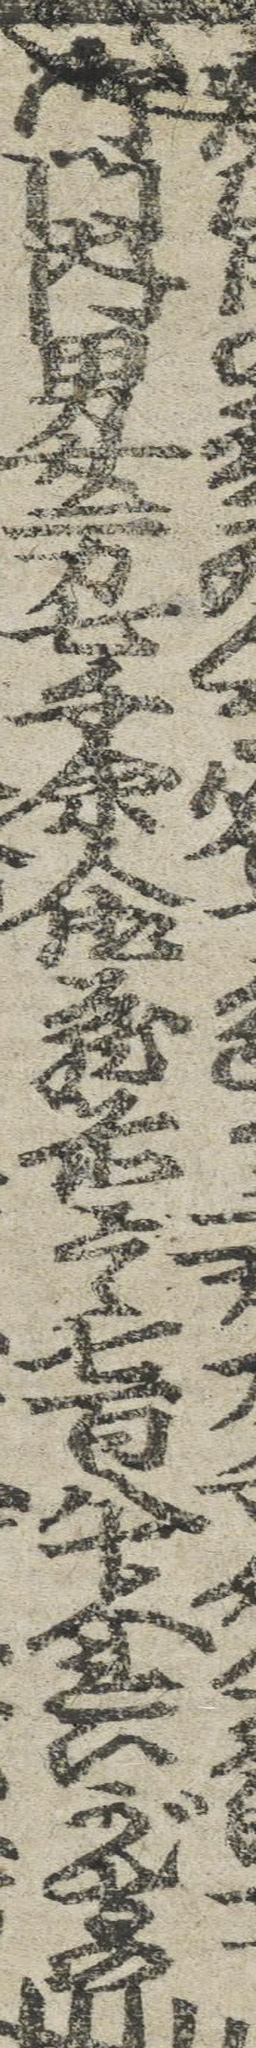御門内男女一万七千余人御蔵前にて七百八十人れいがん寺の
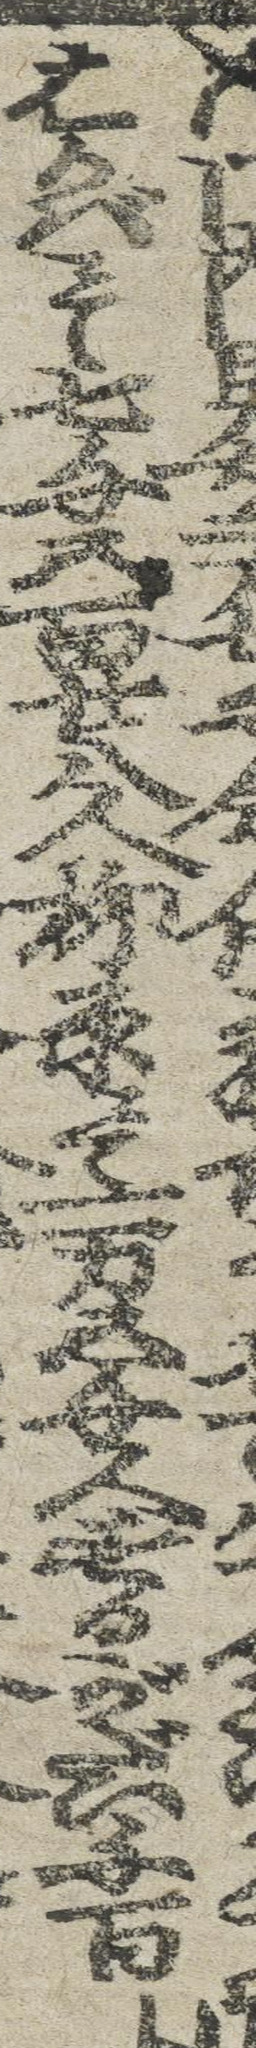はかばにて七千八百廿八人柳原にて一万五千人するがだい千百
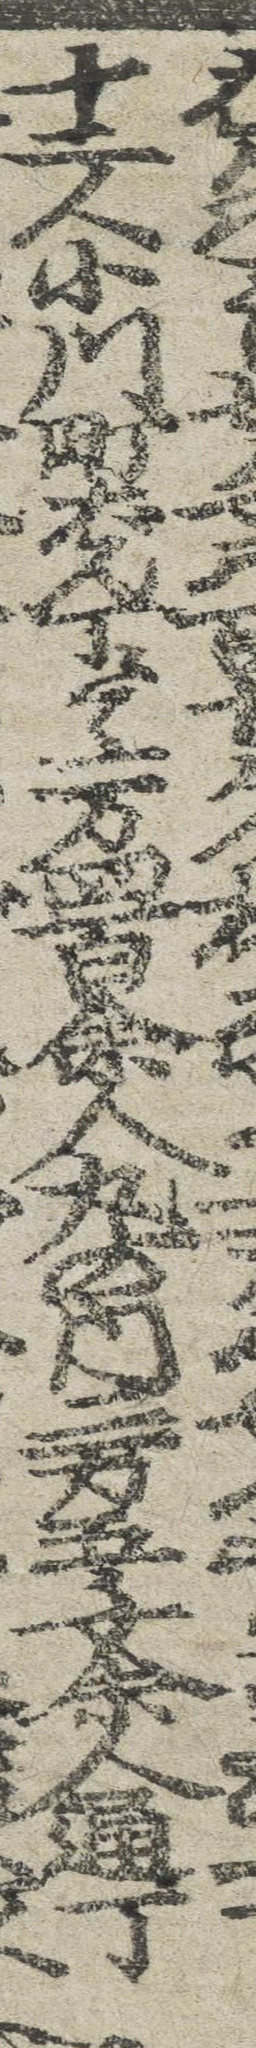十二人小川町ばん丁にて一万四百余人丸の内二万五千余人通丁
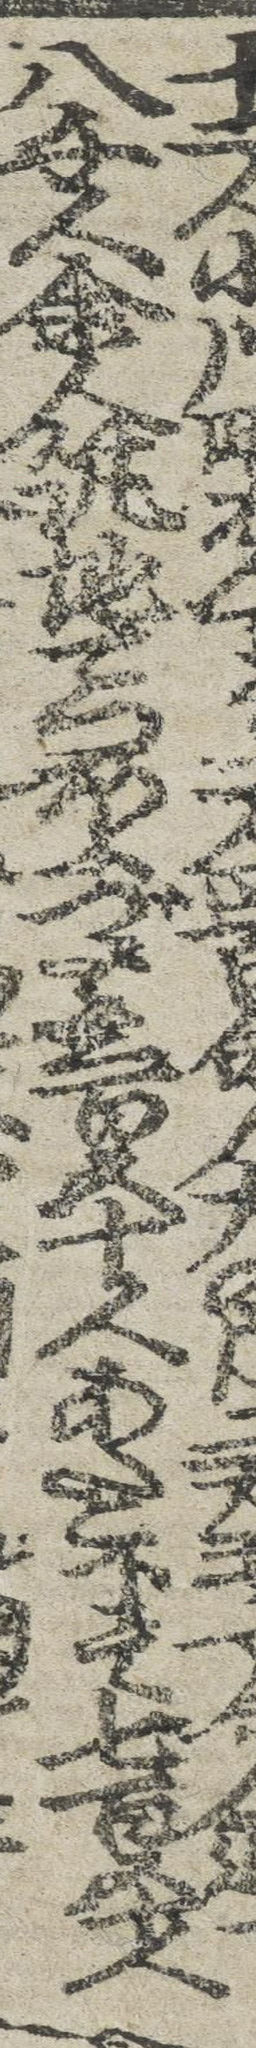八千人余人筑地てつほふづにて三百五十人あたこ下にて七百五十人
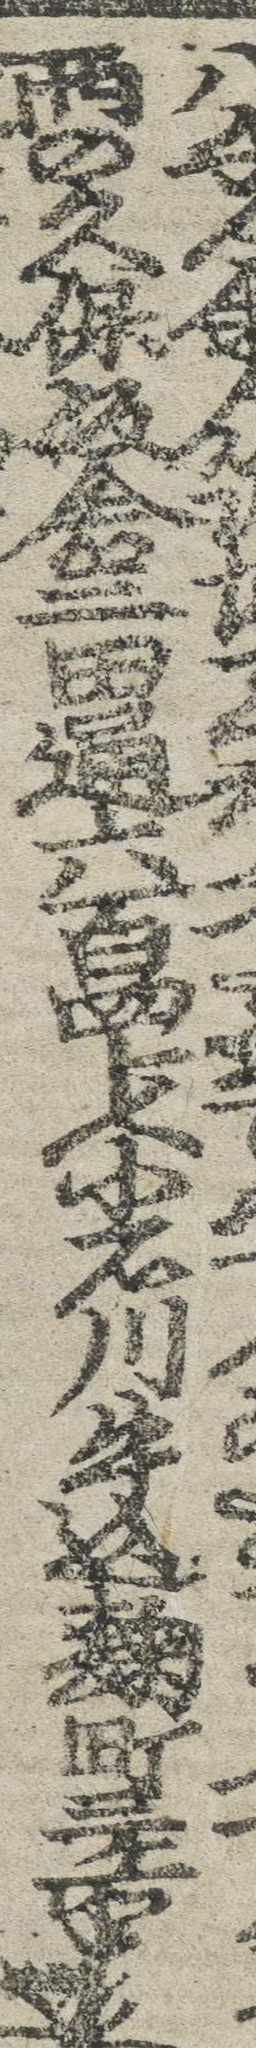西の久保飯倉三田通六百四十人小石川牛込麹町三ヶ所
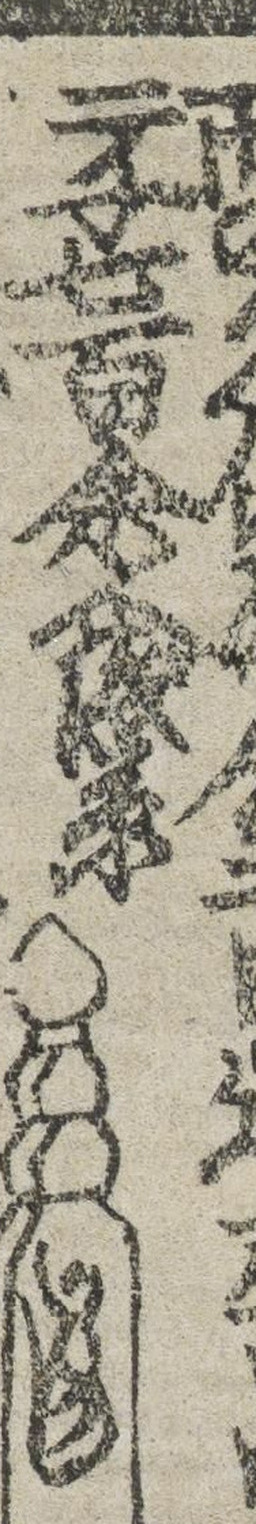二千七百余人浅草
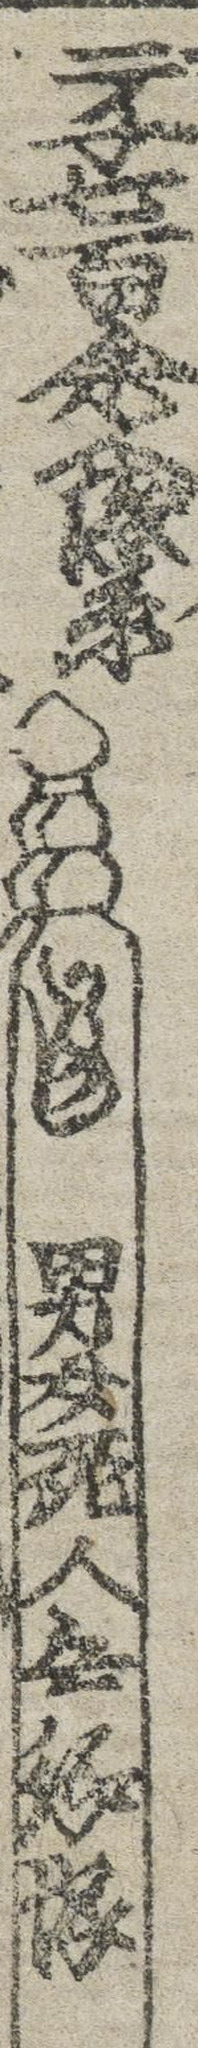二千七百余人浅草
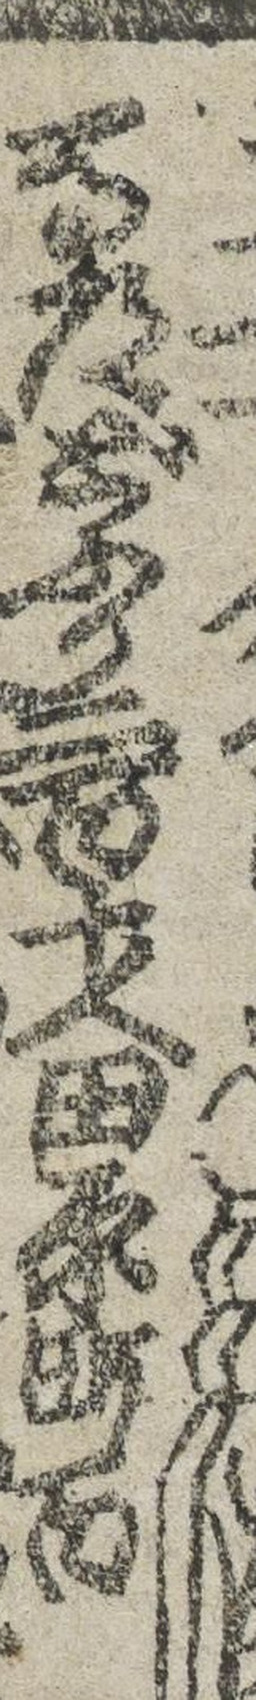馬道どふり二百十人田原町百
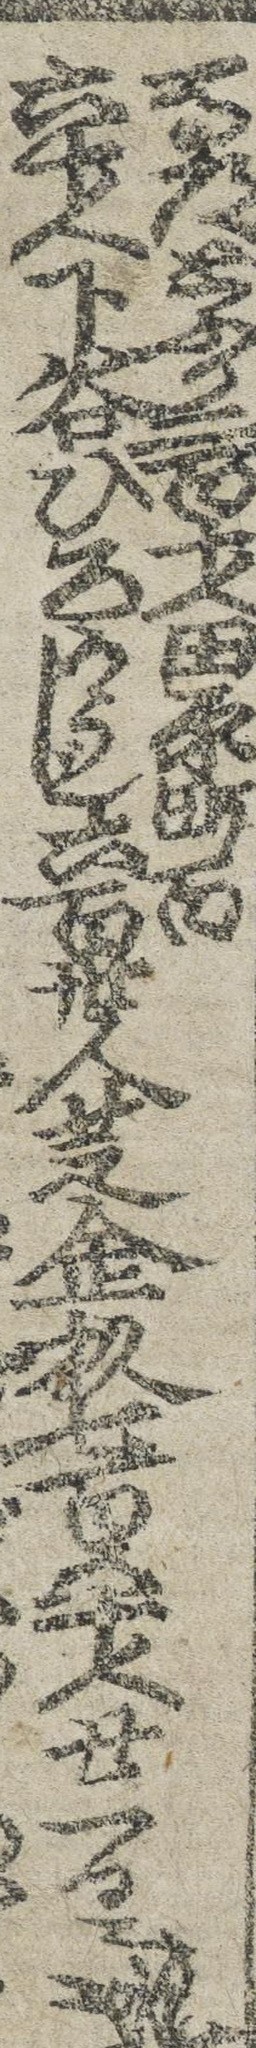六十人下谷ひろかうじ六百丗人芝金杉七百五十人廿一日
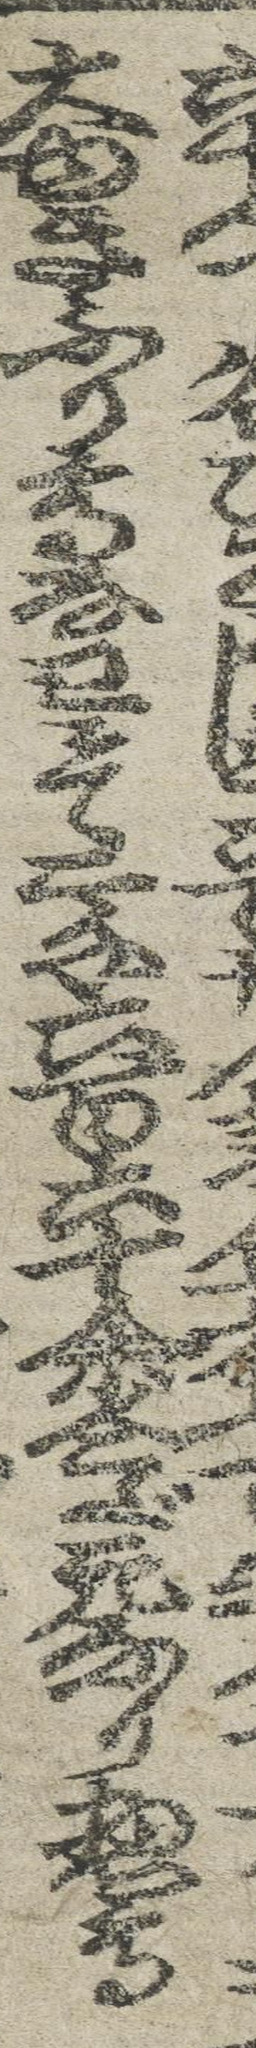大ゆきふり高なわにて二千六百六十余人こゞへ死なり惣高
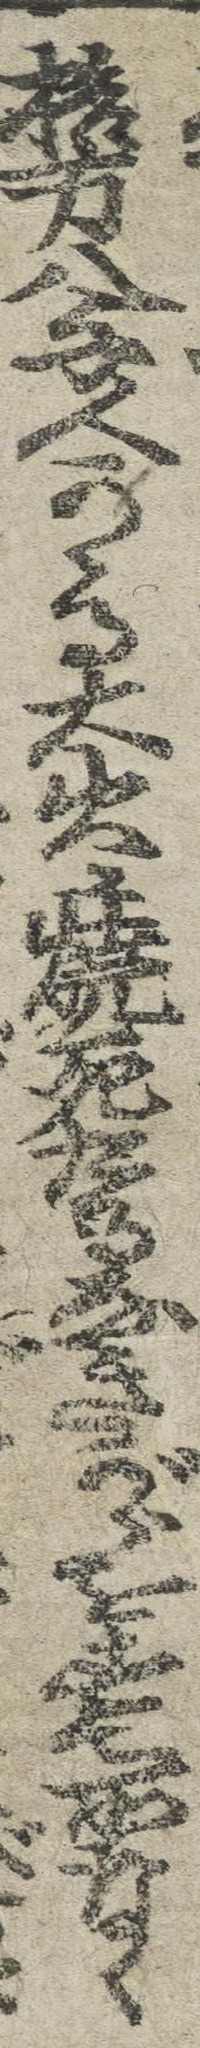拾万八千人かゝる大火焼死たるなきがらをすて所なく
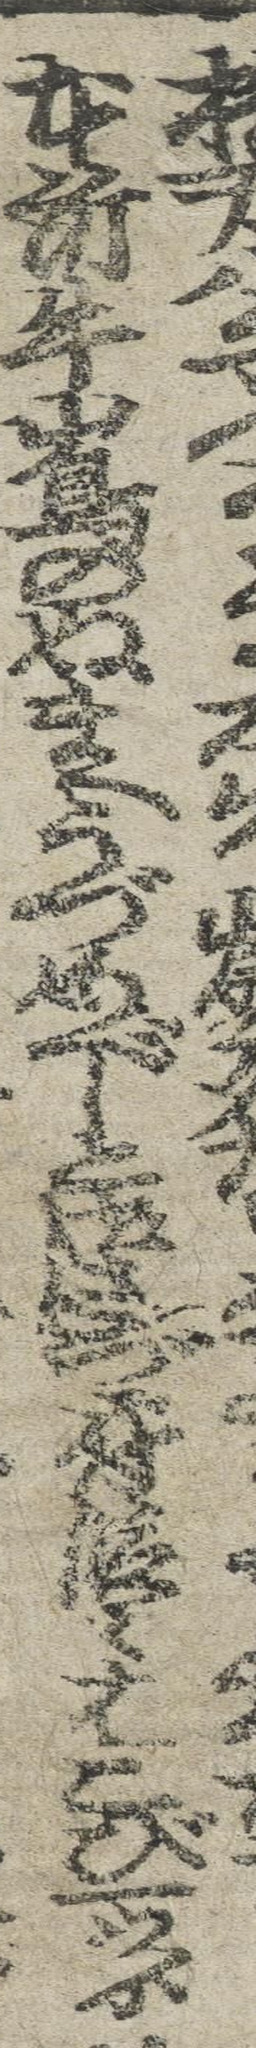本所牛嶌のぬまへうづめべしと御さしづに付沼にはこび一ツゟ
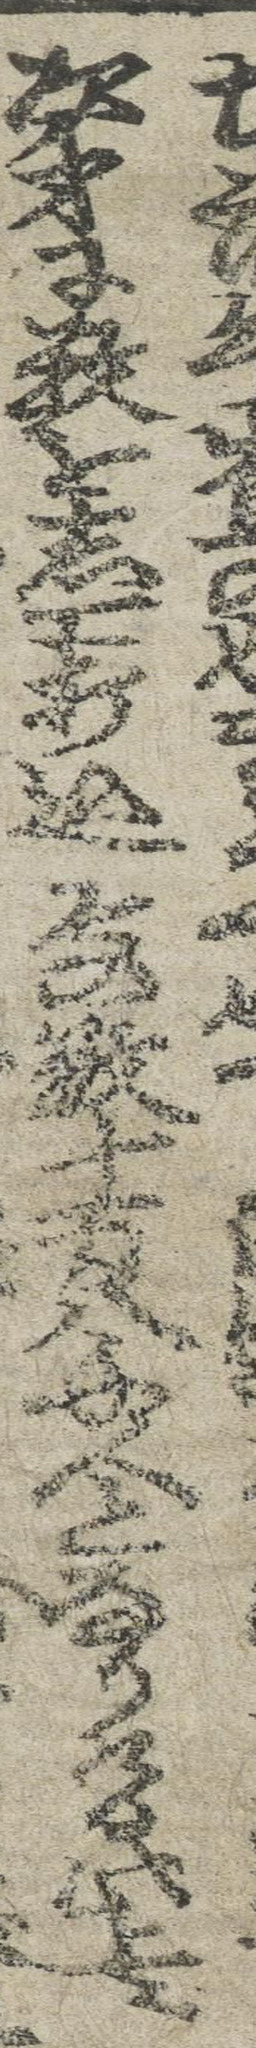次第に数をして打込その数十万八千人となりける此上に

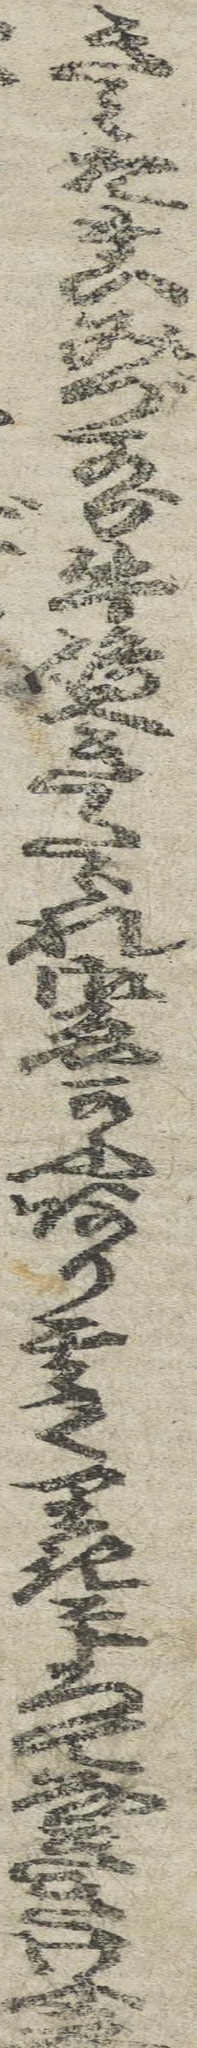きゝたまいみづから牛嶋へきたられ御ゑかふあり其くりきによつてなきさけふこえ
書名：[明暦大火に関する冊子]
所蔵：東京大学地震研究所図書室 Earthquake Research Institute Library, The University of Tokyo, JAPAN
